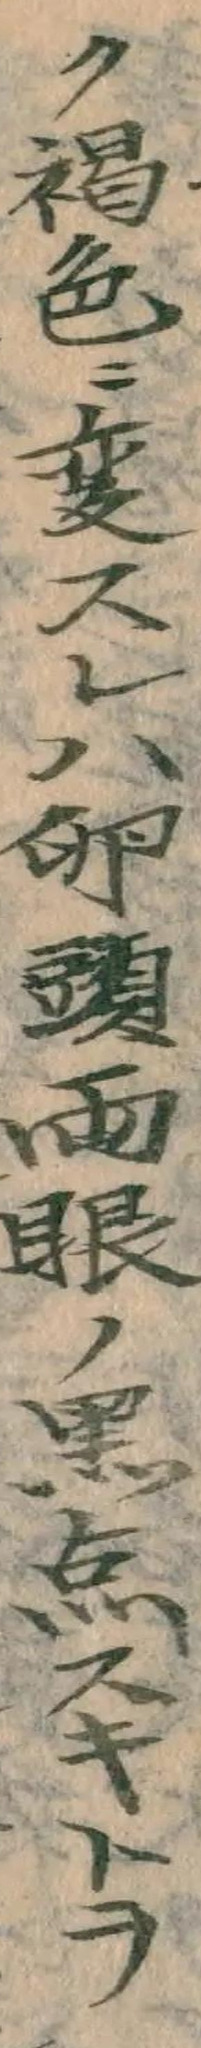ク褐色ニ変スレハ卵頭両眼ノ黒点スキトヲ
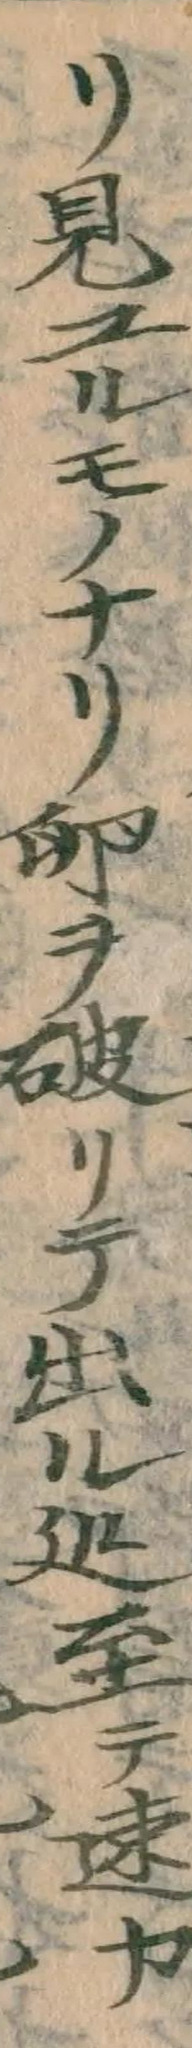リ見ユルモノナリ卵ヲ破リテ出ル処至テ速カ
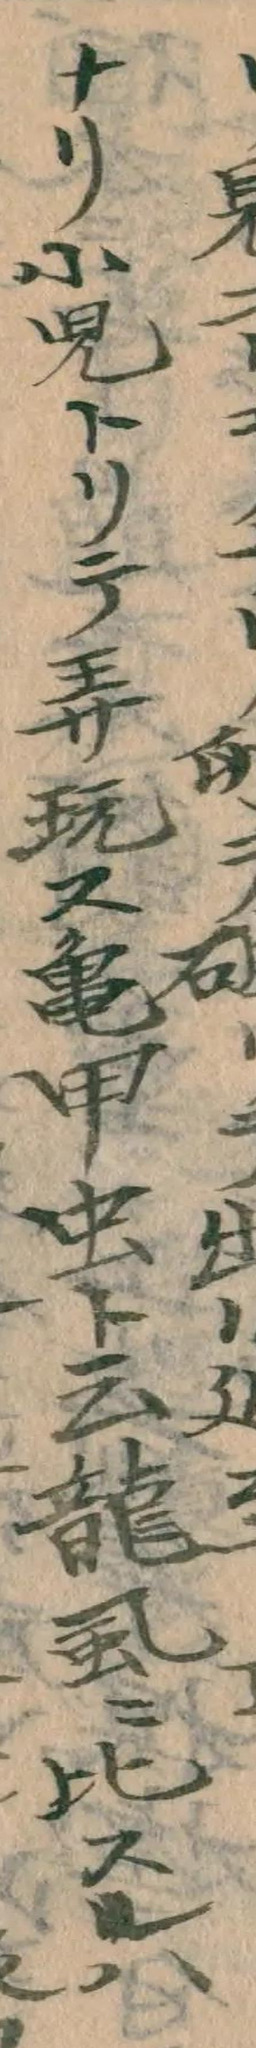ナリ小児トリテ弄玩ス亀甲虫ト云龍虱ニ比スレハ
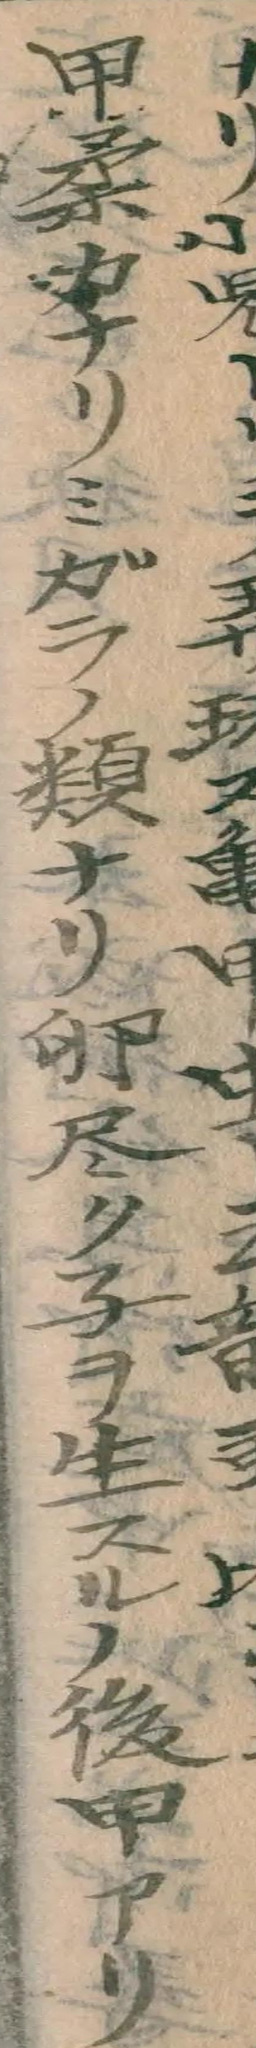甲柔カナリミガラノ類ナリ卵尽ク子ヲ生スルノ後甲アリ
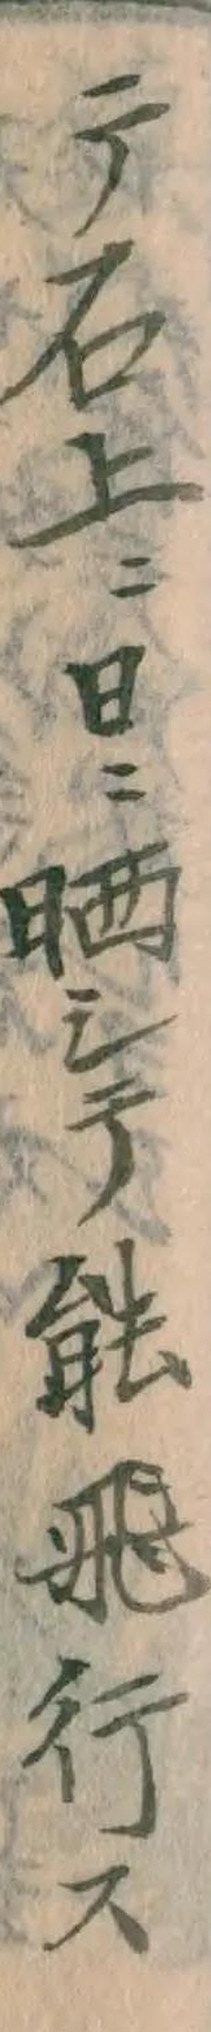テ石上ニ日ニ晒シテ能飛行ス
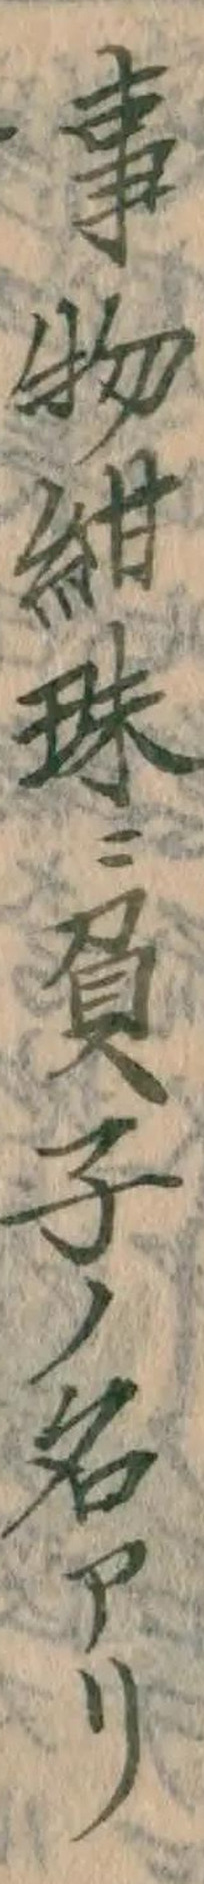事物紺珠ニ負子ノ名アリ
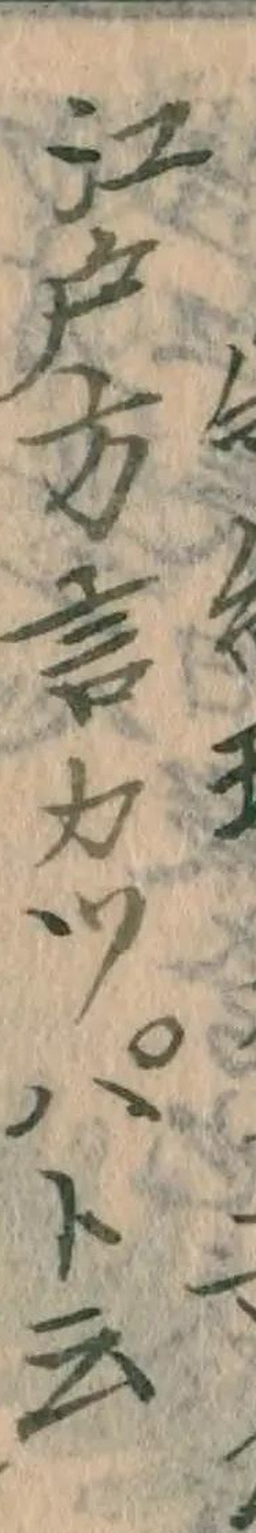江戸方言カツパト云
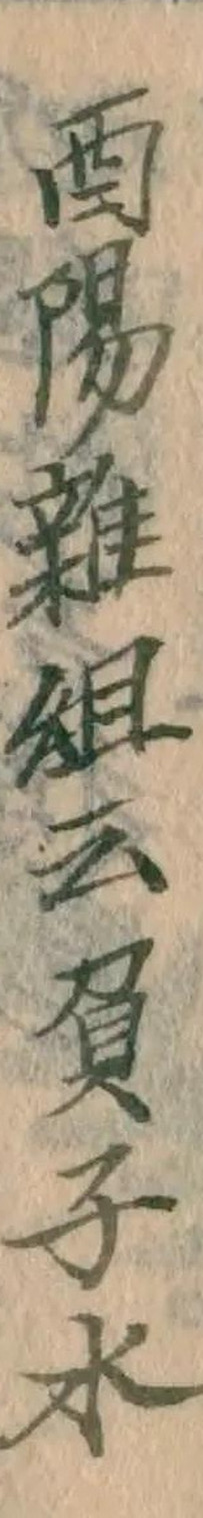酉陽雑俎云負子水
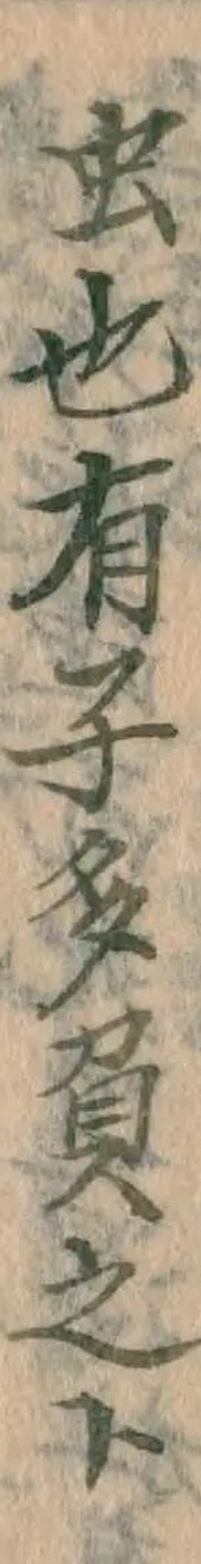虫也有子多負之ト
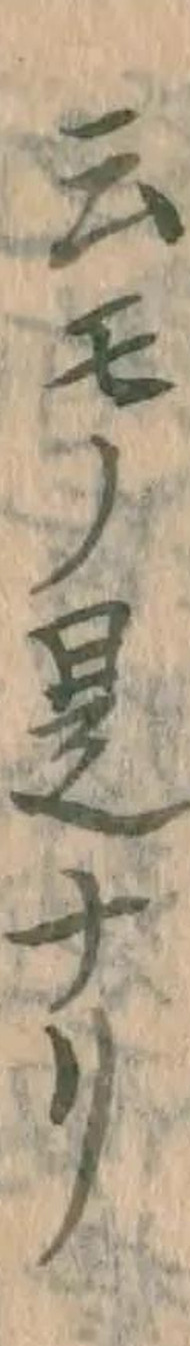云モノ是ナリ
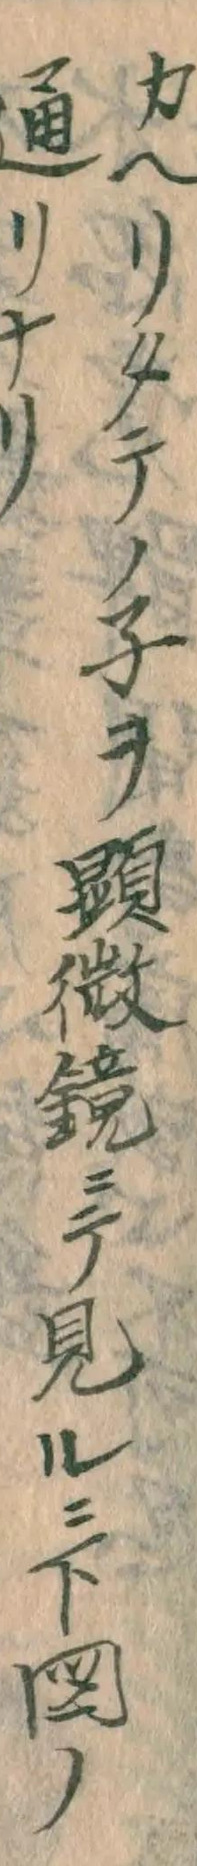カヘリタテノ子ヲ顕微鏡ニテ見ルニ下図ノ
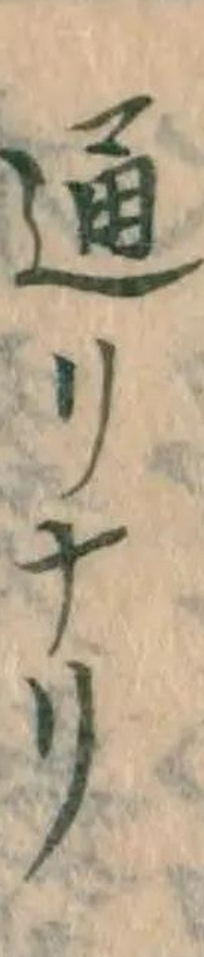通リナリ
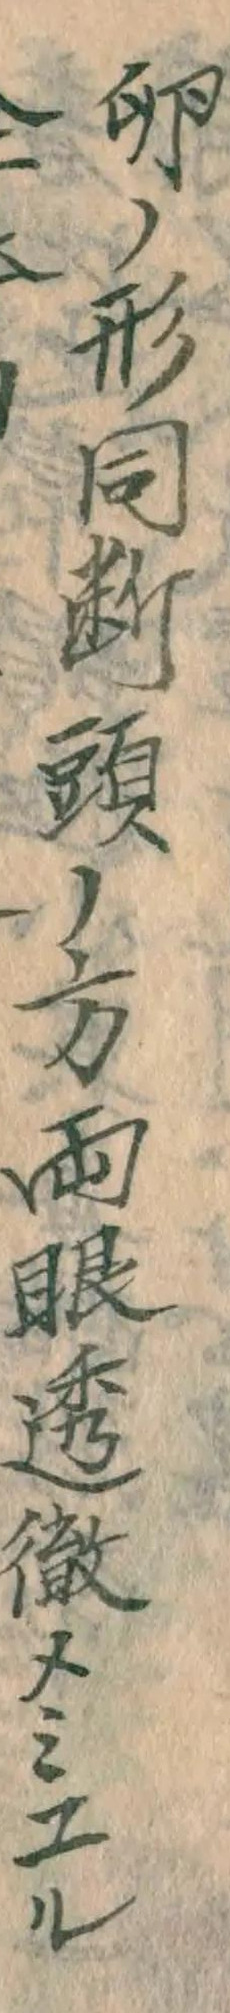卵ノ形同断頭ノ方両眼透徹シテミユル
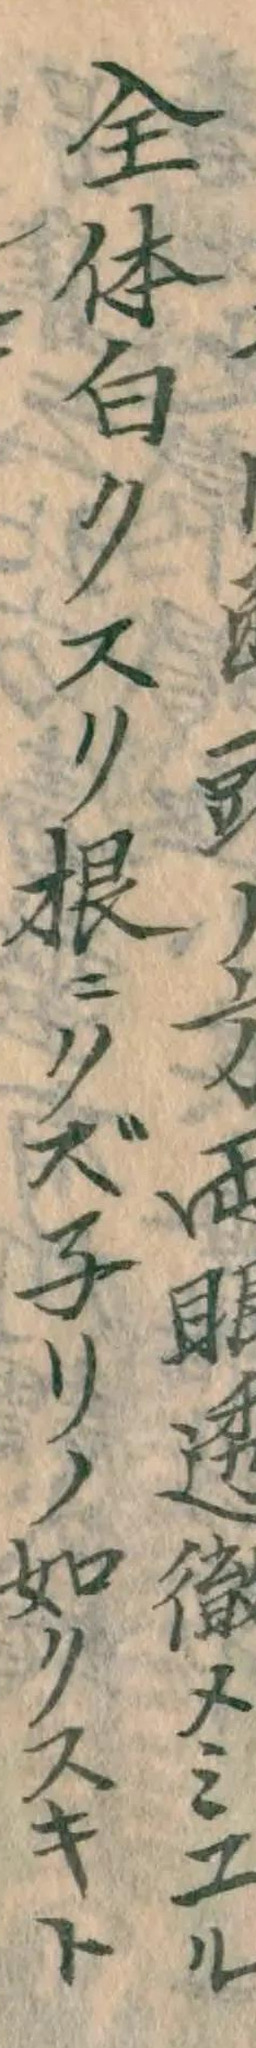全体白クスリ根ニクズネリノ如クスキト
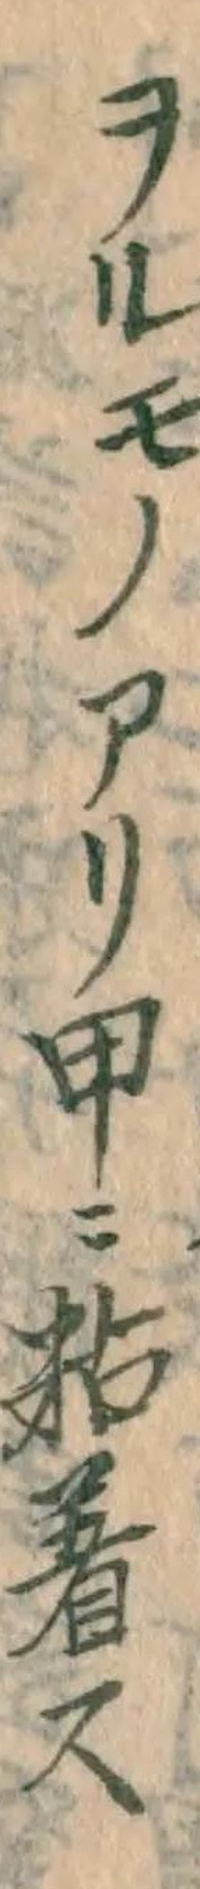ヲルモノアリ甲ニ粘着ス

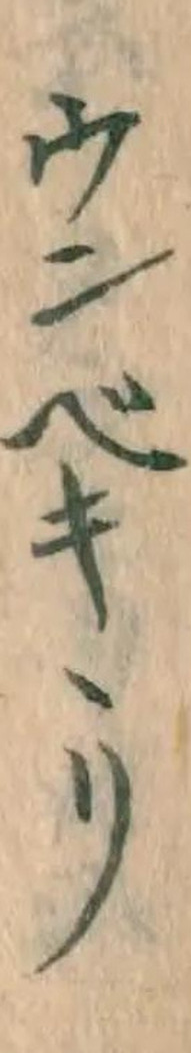ウンベキヽリ
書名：千蟲譜 3巻. [3]
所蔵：国立国会図書館 National Diet Library, JAPAN
